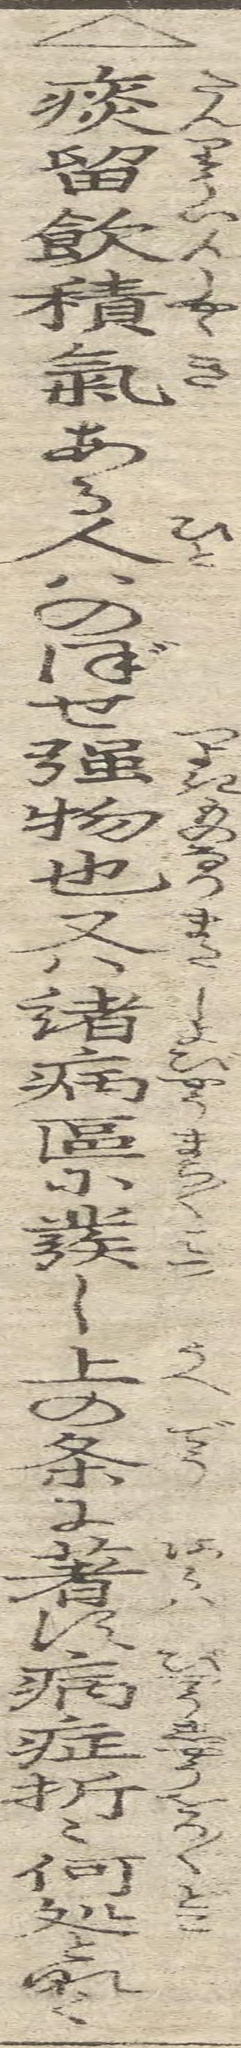△痰留飲積気ある人はのぼせ強物也又は諸病区に発し上の条に著す病症折々何処となく
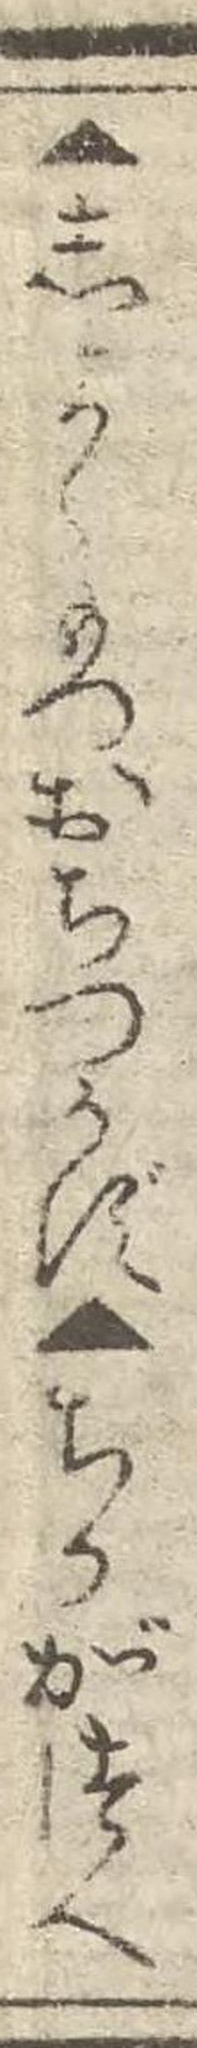▲しよくもつおちつかず▲ちかがつへ
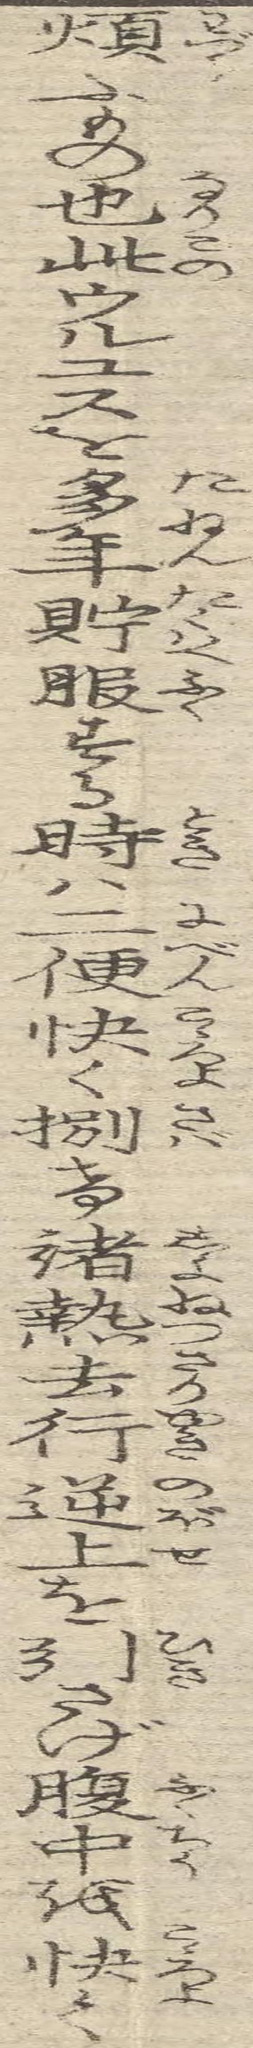煩ふもの也此ウルユスを多年貯服する時は二便快く捌け諸熱去行逆上を引さげ腹中を快く
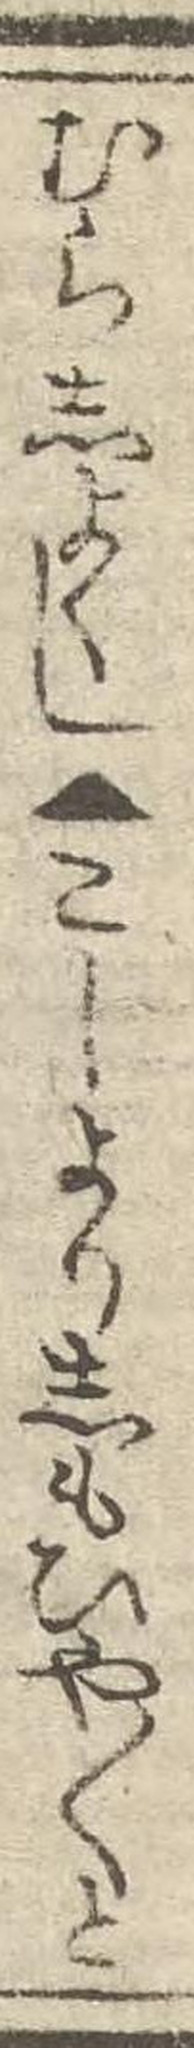むらしよくし▲こしよりしもひや〳〵と
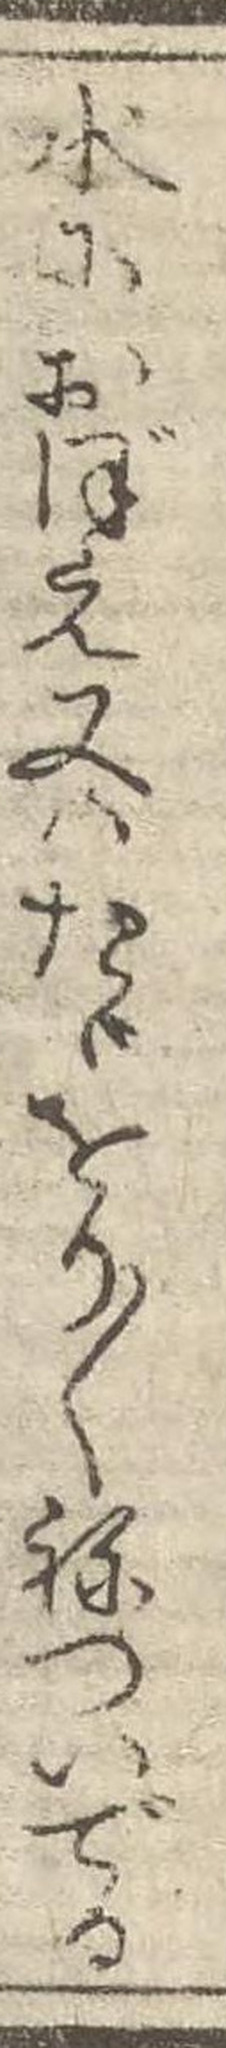水におぼえ又はたゞをり〳〵ねついでる
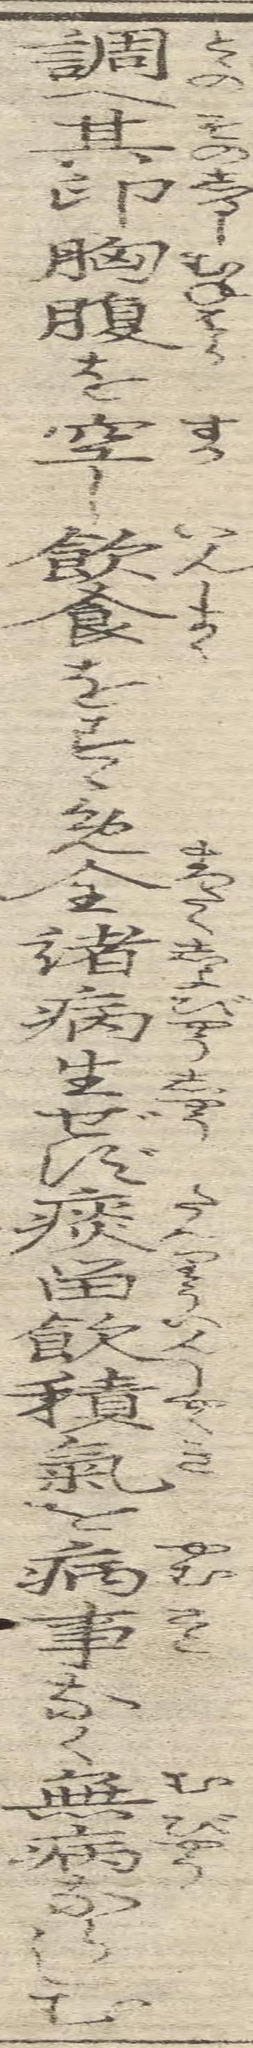調へ其印胸腹を空し飲食をすゝめ全諸病生ぜず痰留飲積気を病事なく無病ならしむ
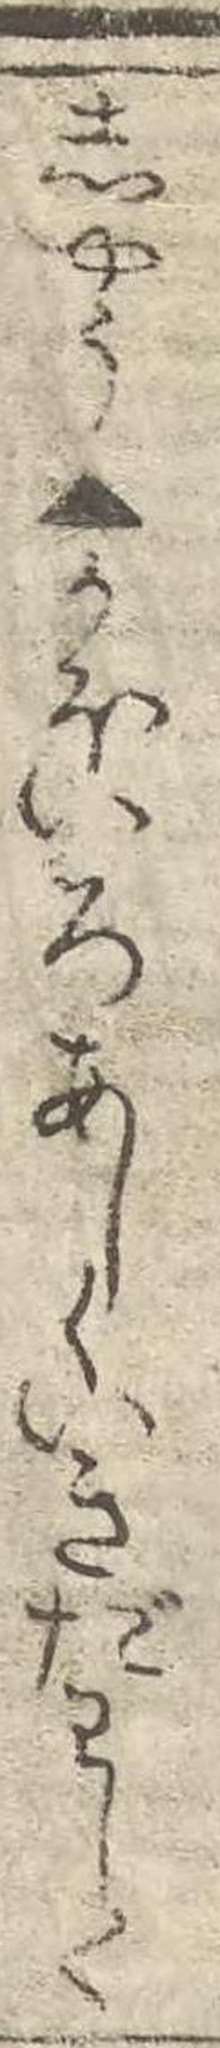しやう▲かほいろあしくいきだわしく
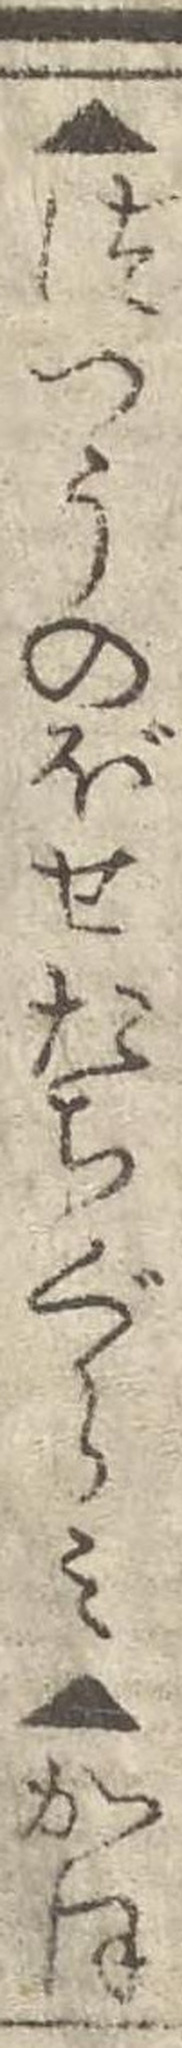▲づつうのぼせたちぐらみ▲かほ
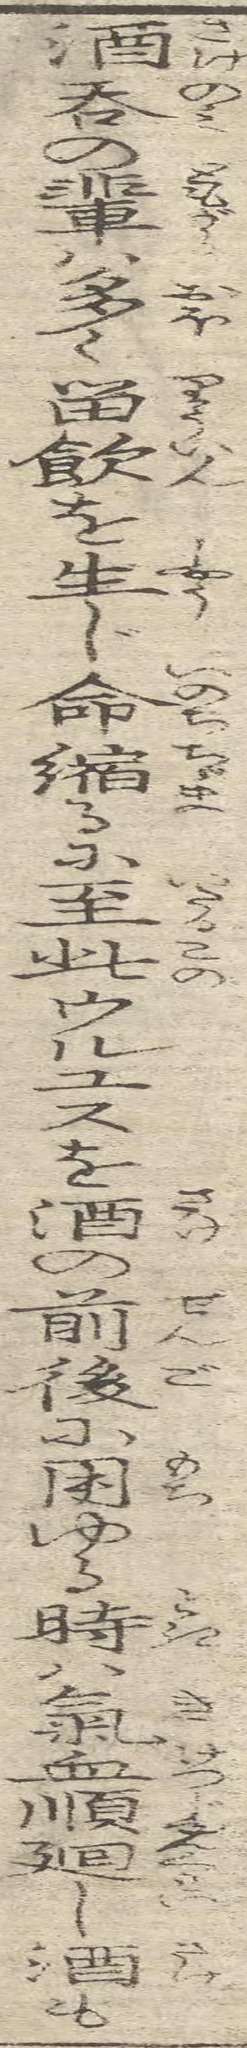酒呑の輩は多く留飲を生じ命縮るに至此ウルユスを酒の前後に用ゆる時は気血順廻し酒も
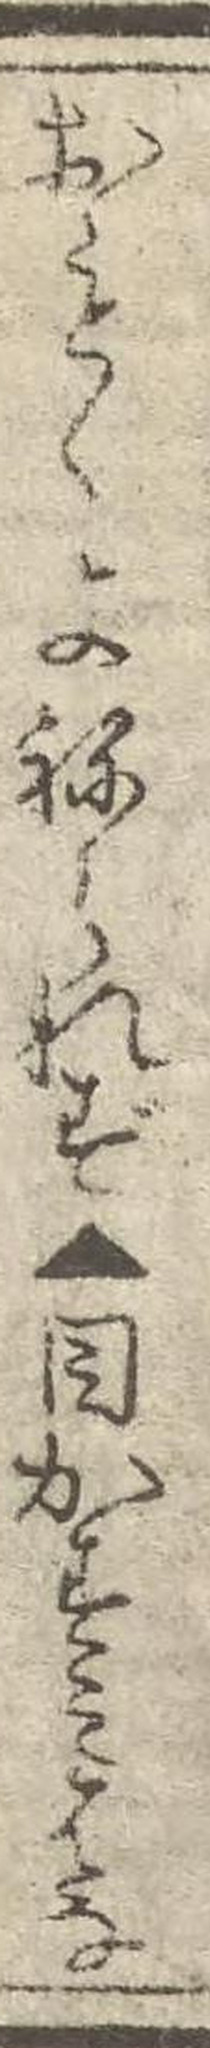おもくよねられず▲目かすみはな
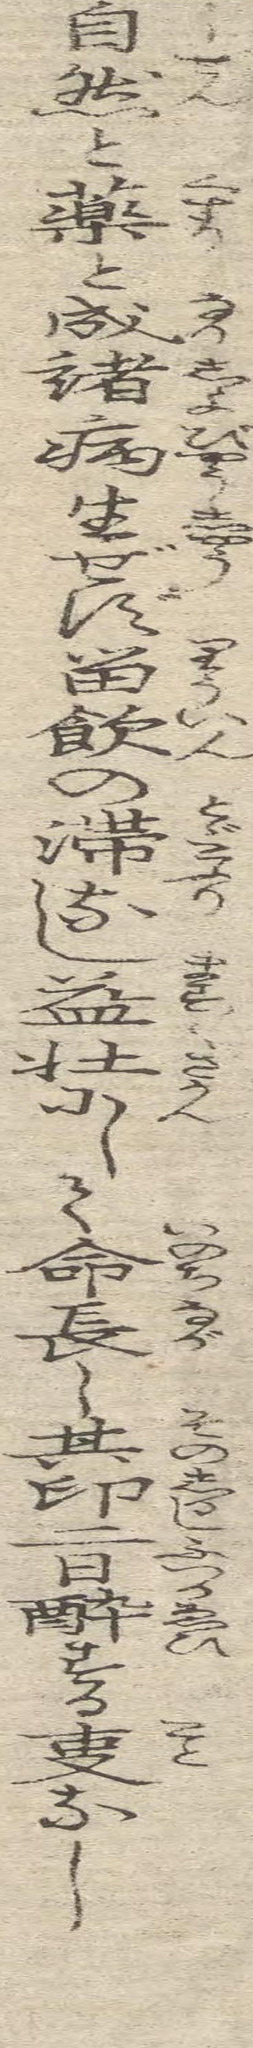自然と薬と成諸病生ぜず留飲の滞なし益壮にして命長し其印二日酔する事なし
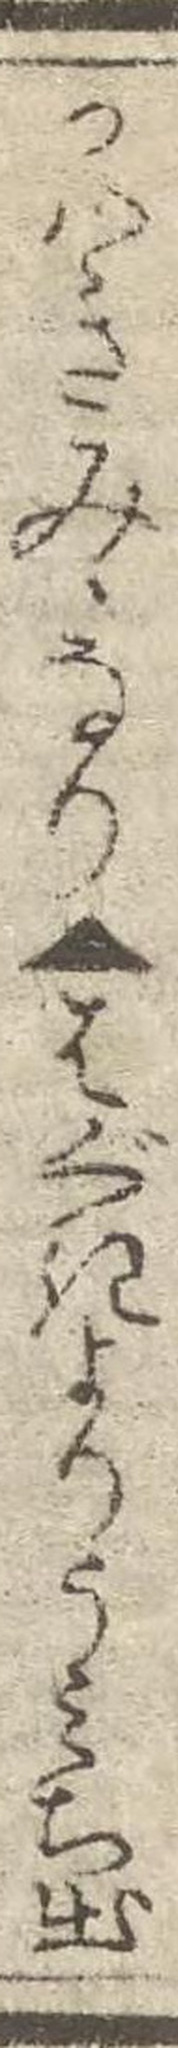かはきみゝなり▲はぐきよりうみち出
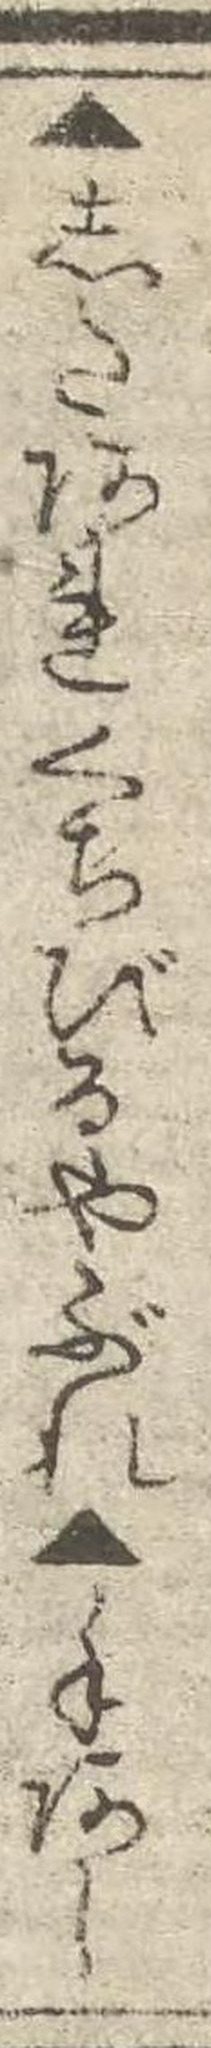▲したあれくちびるやぶれ▲手あし
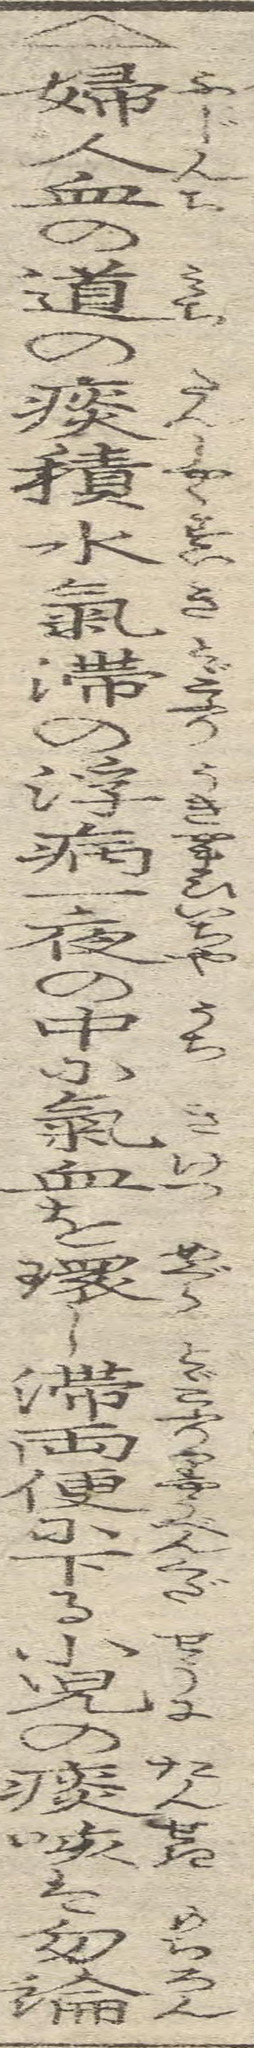△婦人血の道の痰積水気滞の浮病一夜の中に気血を環し滞両便に下る小児の痰咳は勿論
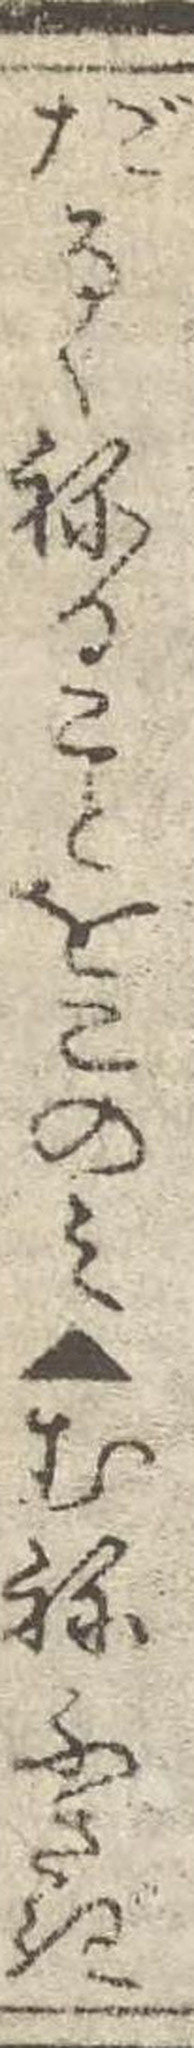だるくねることをこのみ▲むねふさぎ
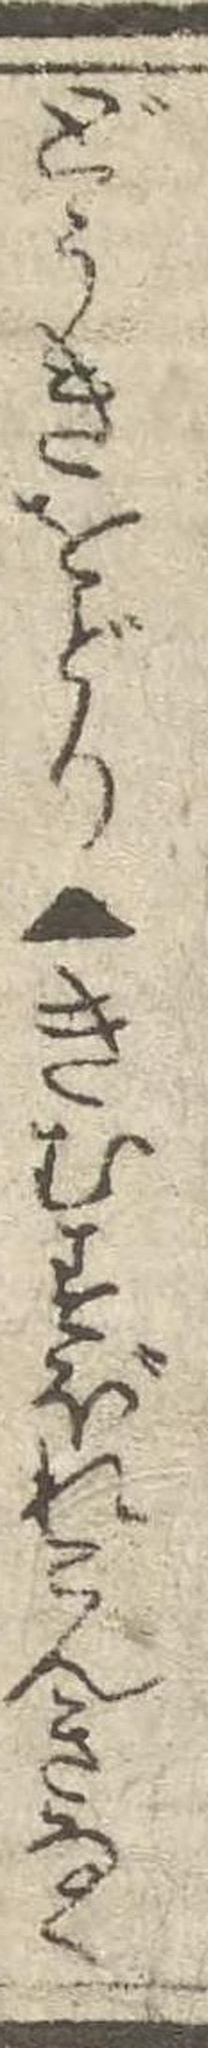どうきをどり▲きむすぼれこんきなく
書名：浪華薬種問屋能書張交帖. 一
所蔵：国立国会図書館 National Diet Library, JAPAN
